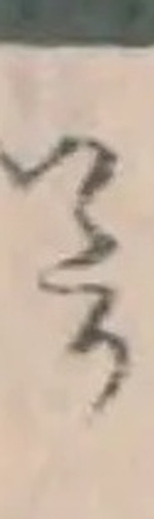いたり
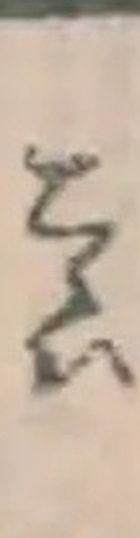こゝは
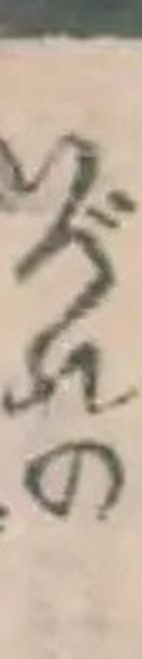いづれの
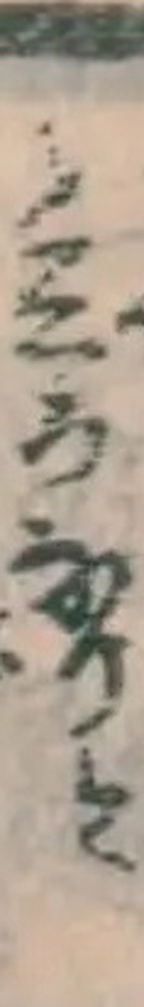ところなりと
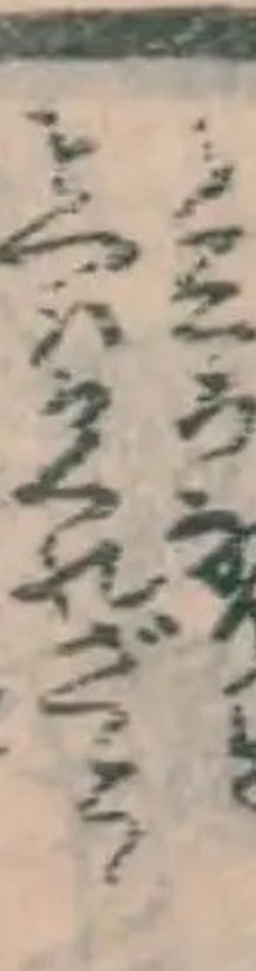とへはかくれざとゝ
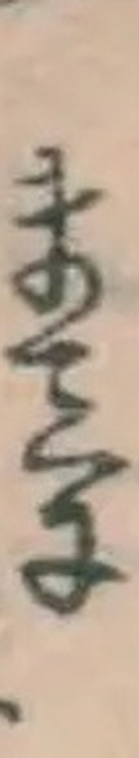まさに
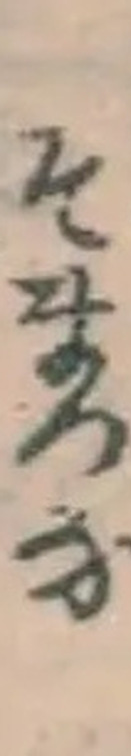そまつな
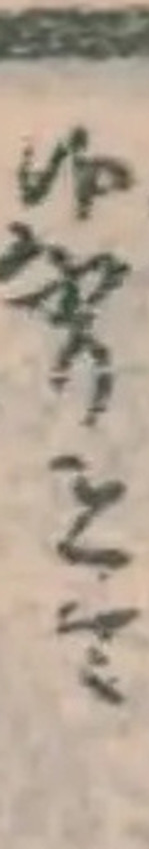候なりとて
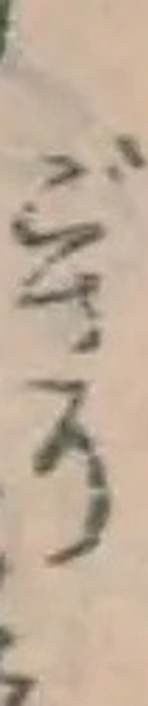ござり
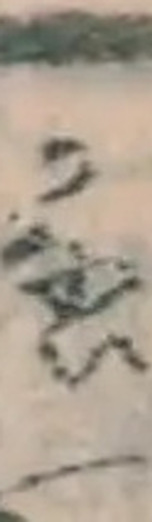かない
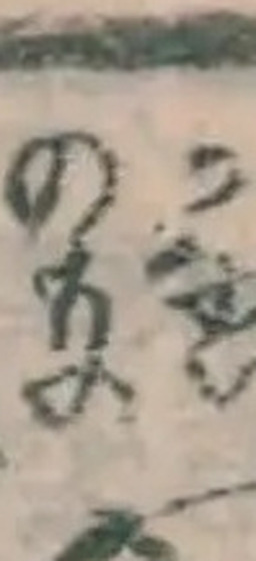のもの
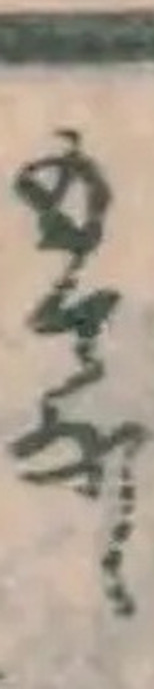もてなし
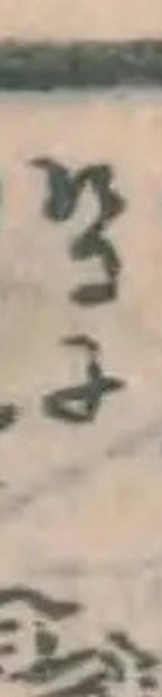けるに
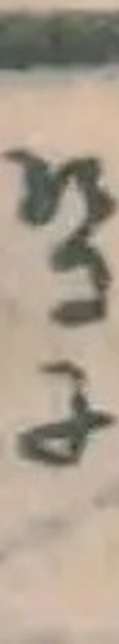けるに
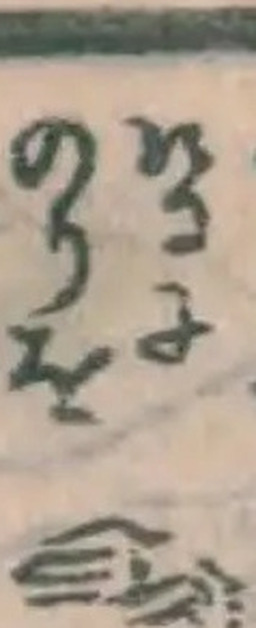のりを
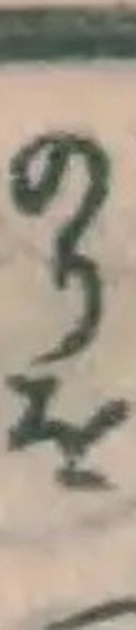のりを
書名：舌切雀
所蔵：国立国会図書館 National Diet Library, JAPAN
